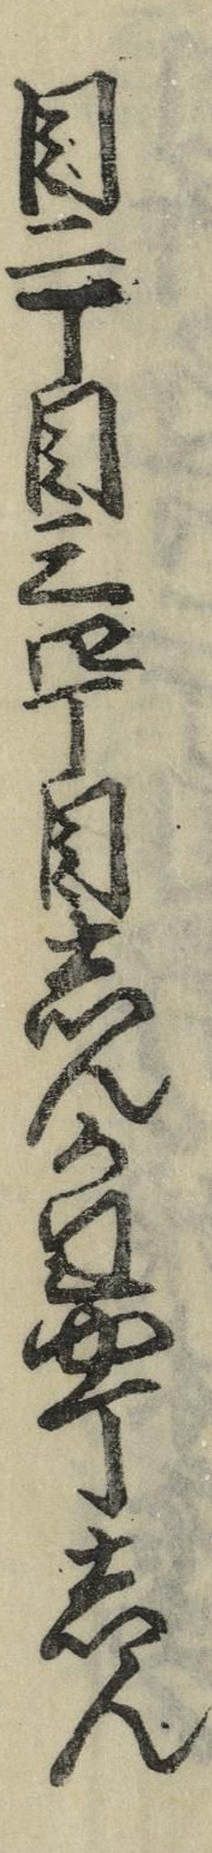目二丁目三四丁目しんかわや丁しん
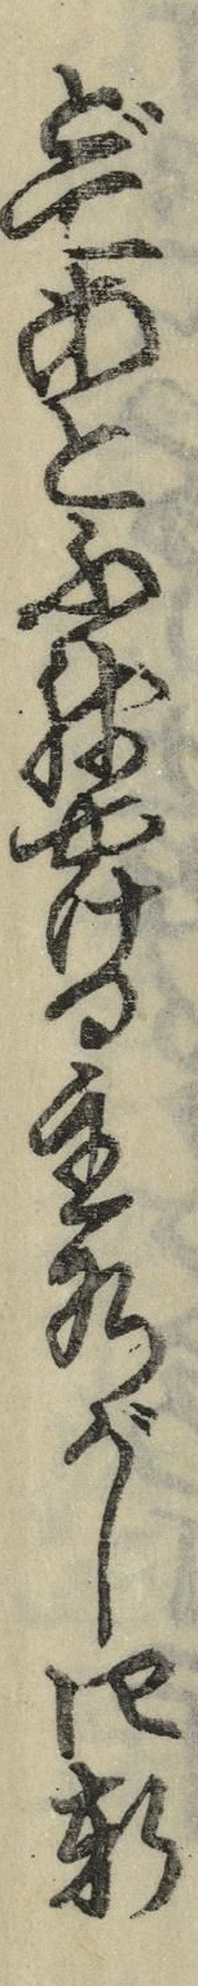どてあと不残やける主水がし四軒
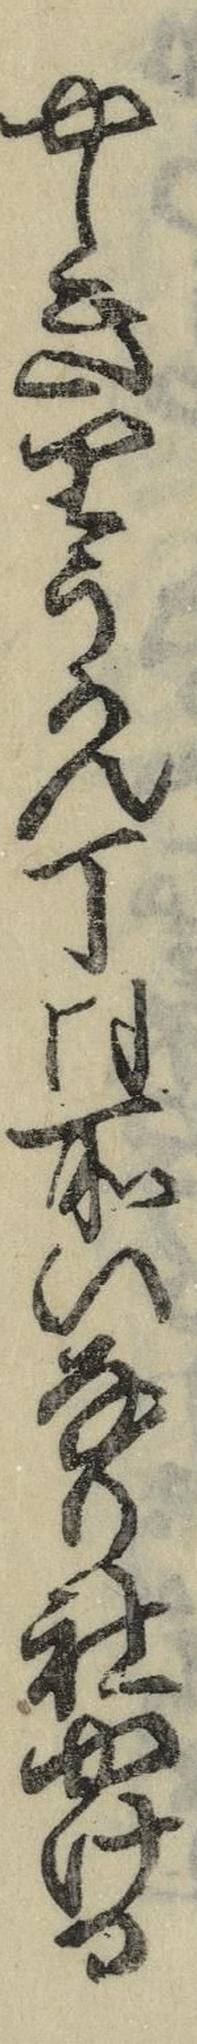やしきりうかん丁同所いなり社やける
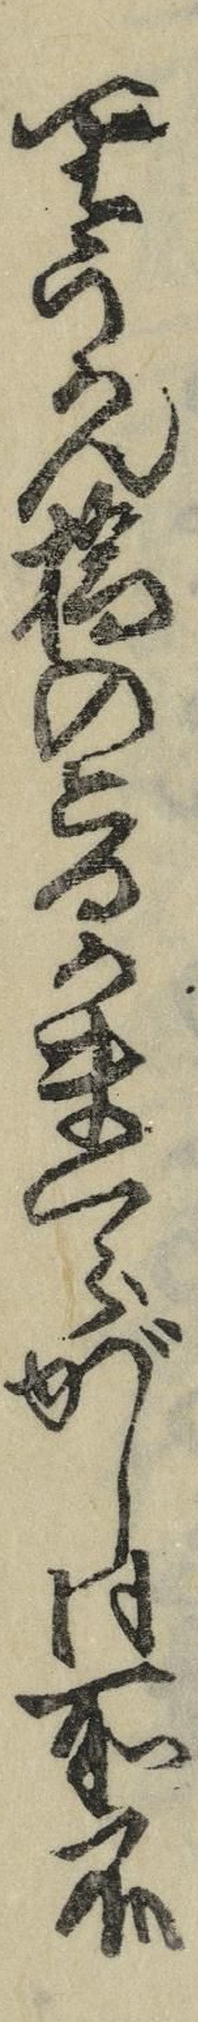りうかん橋のこるかまてらがし同所不
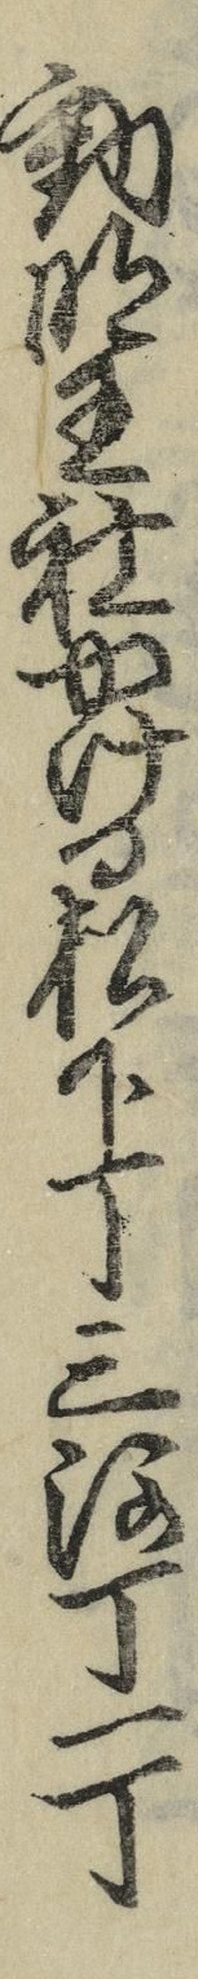動明王社やける松下丁三河丁一丁
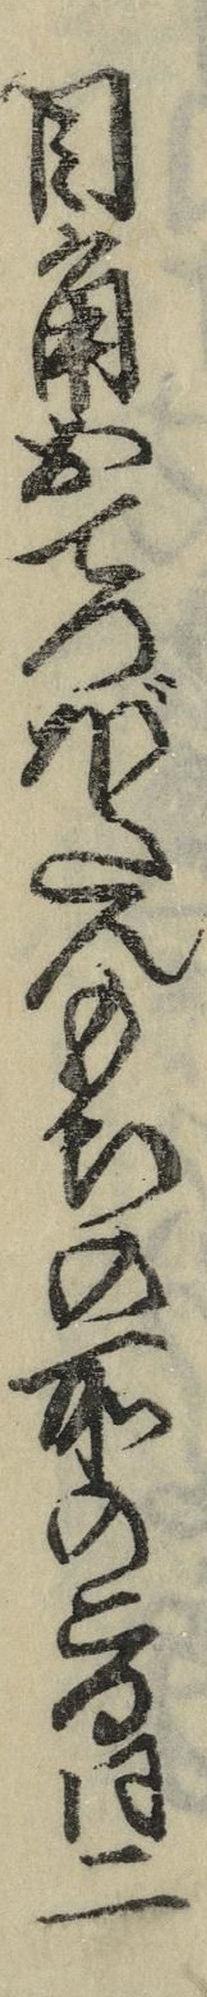目角おてつぼたんもちの所のこる同二
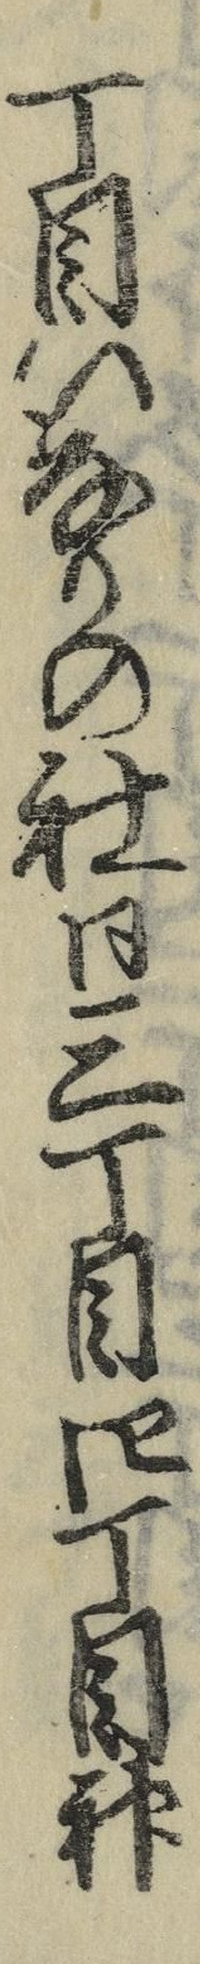丁目いなりの社同三丁目四丁目神
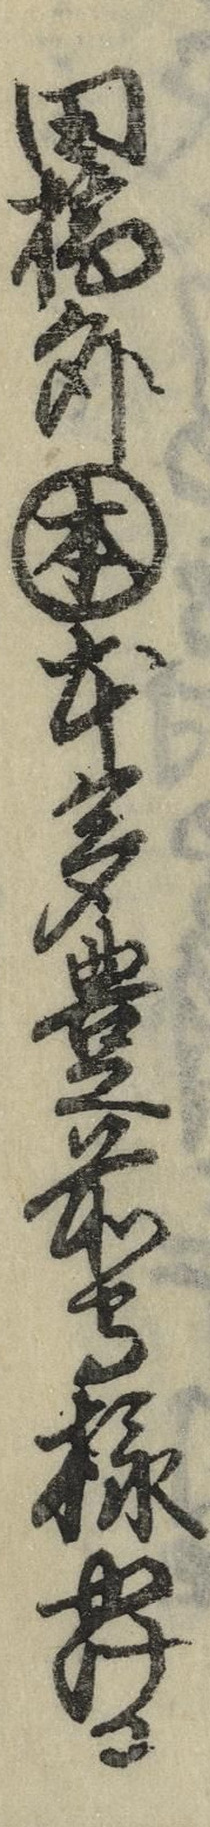田橋外本多豊前守様やける
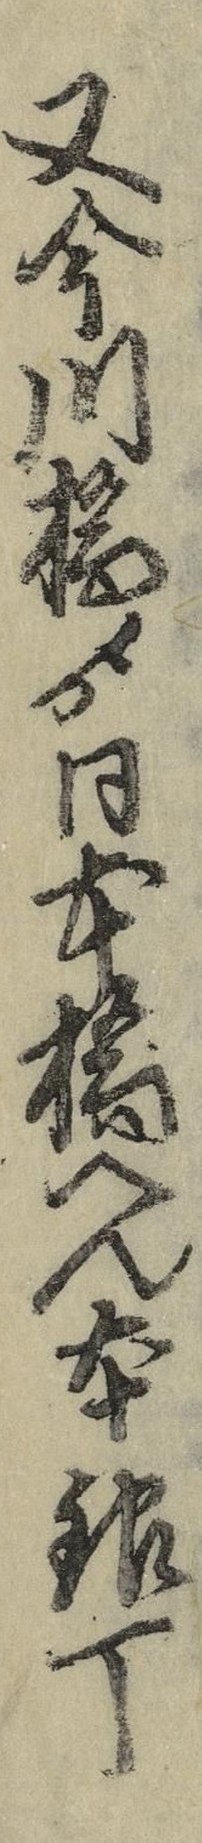又今川橋ゟ日本橋へん本銀丁

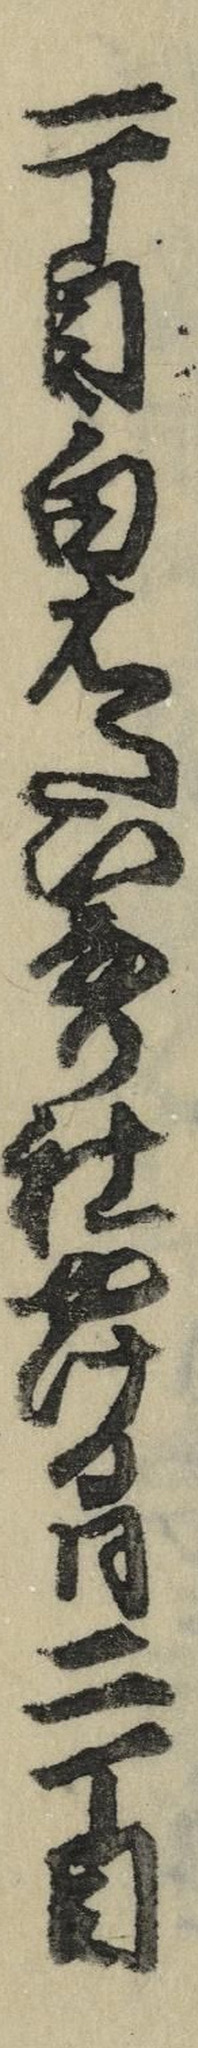一丁目白はたいなり社やける同二丁目
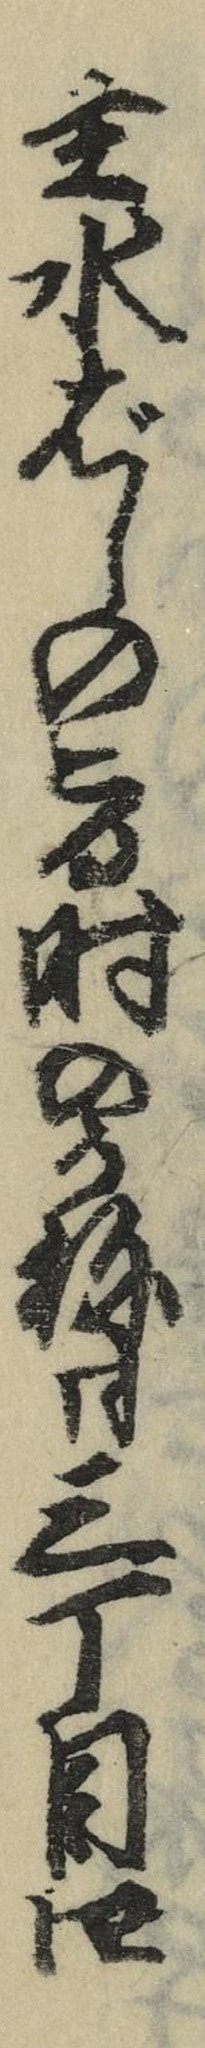主水ばしのこる時の御縁日三丁目四
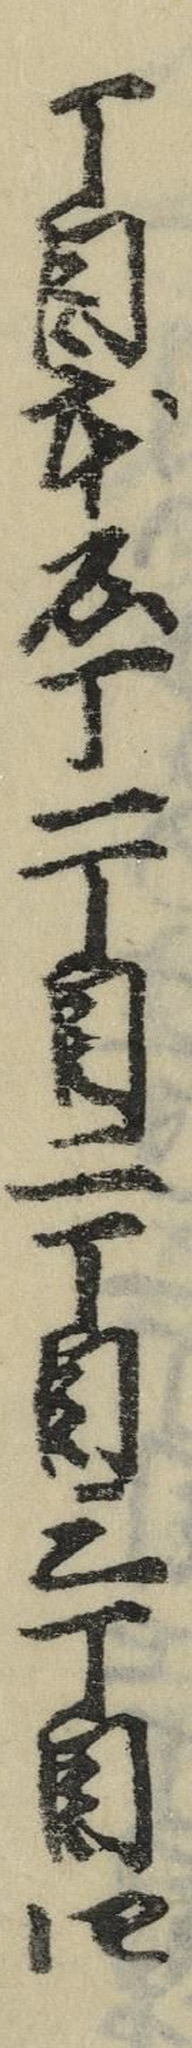丁目本石丁一丁目二丁目三丁目四
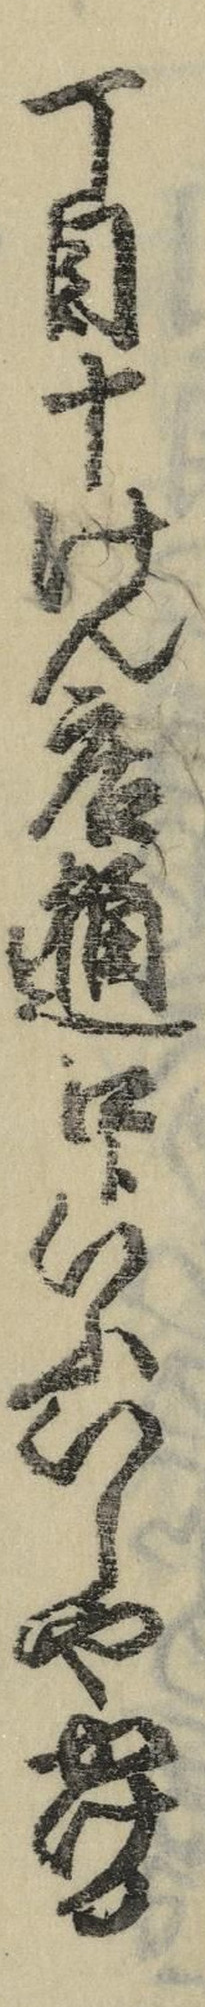丁目十けん店樋口といふいしややける
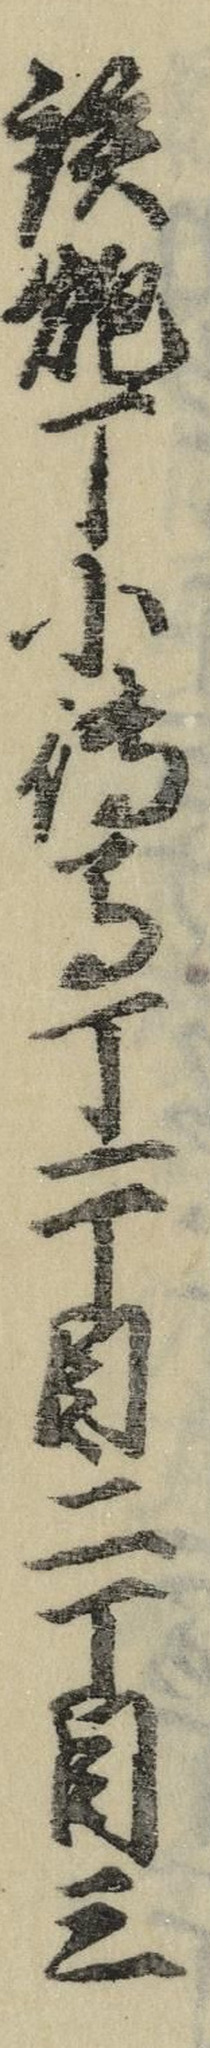鉄炮丁小伝馬丁一丁目二丁目三
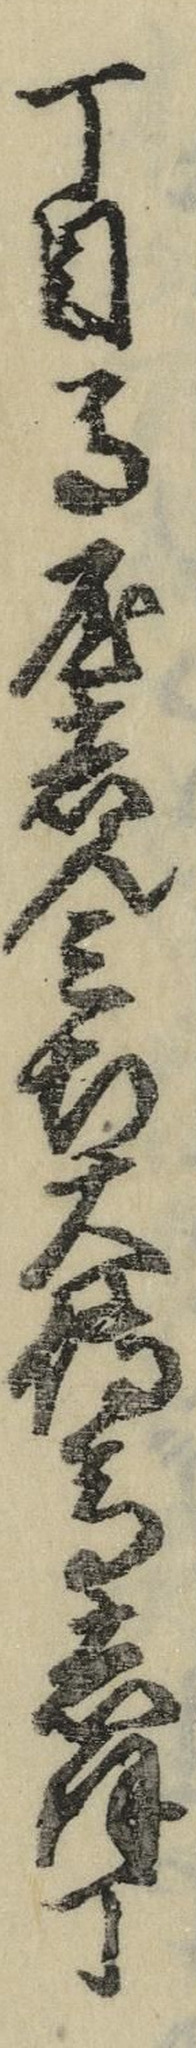丁目寺やしんみち大伝馬した丁
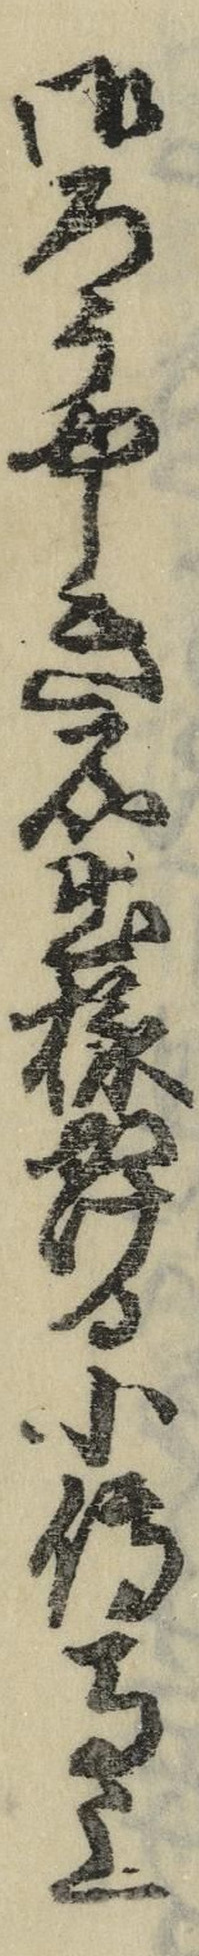御ろうやしき石出様やける小伝馬上
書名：大江戸焼場所明細之写　附出火方角画圖　戊午安政五年十一月十五日
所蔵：東京大学地震研究所図書室 Earthquake Research Institute Library, The University of Tokyo, JAPAN
